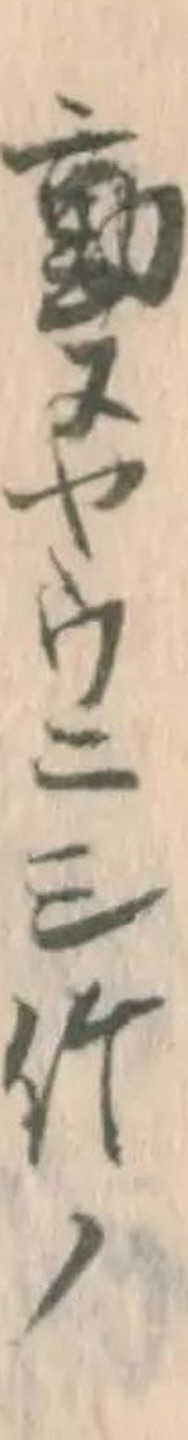動ヌヤウニシ竹ノ
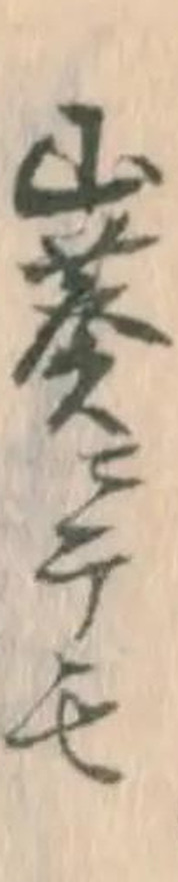山葵ニテモ
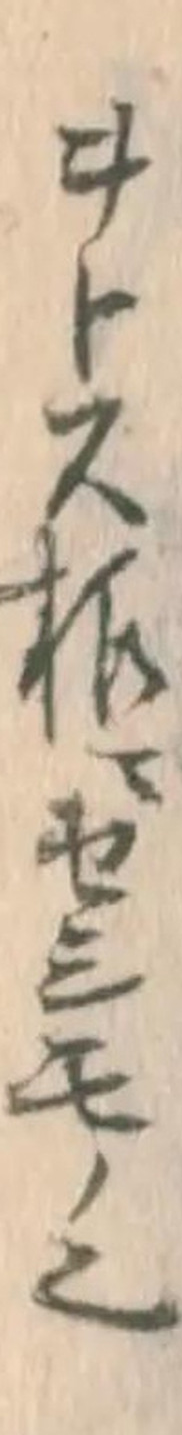ヲトス様ニセシモノ也
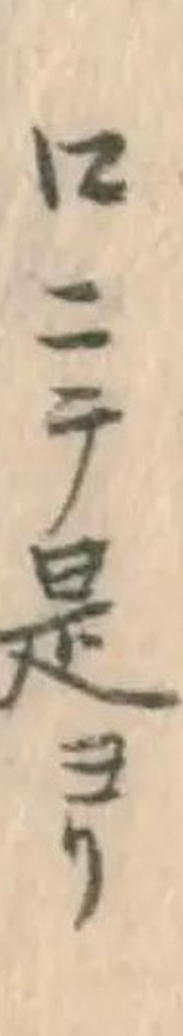口ニテ是ヨリ
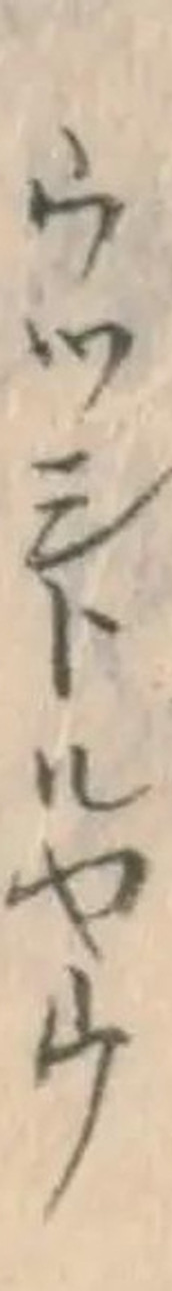ウツシトルヤウ
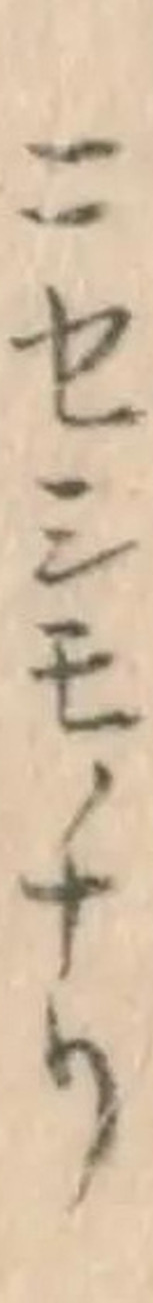ニセシモノナリ
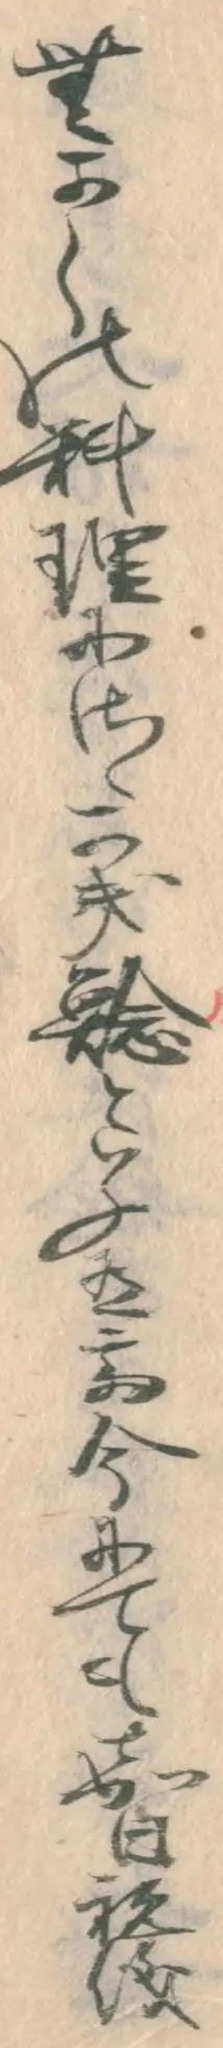むかしの料理にさゝかき鯰といふ有て今にても嘉日祝儀

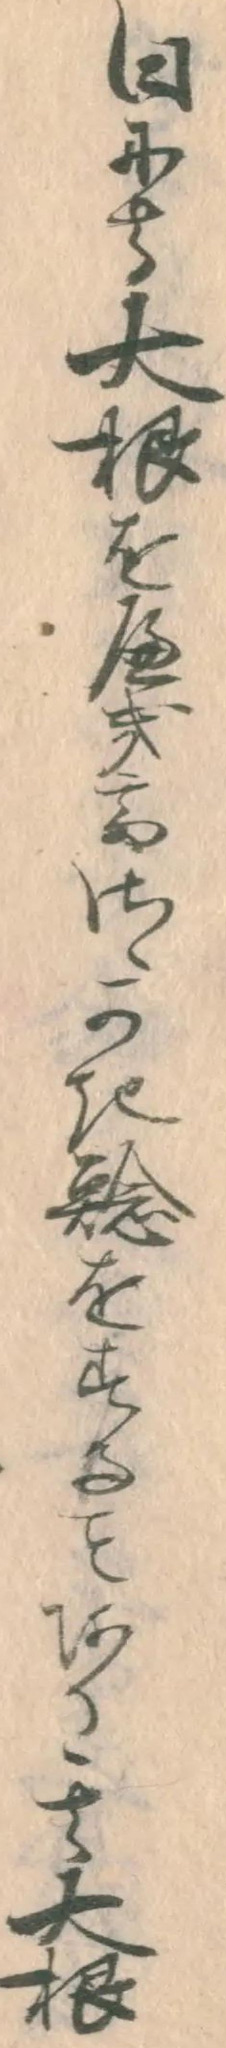日には大根をへきてさゝかき鯰をするもあり其大根
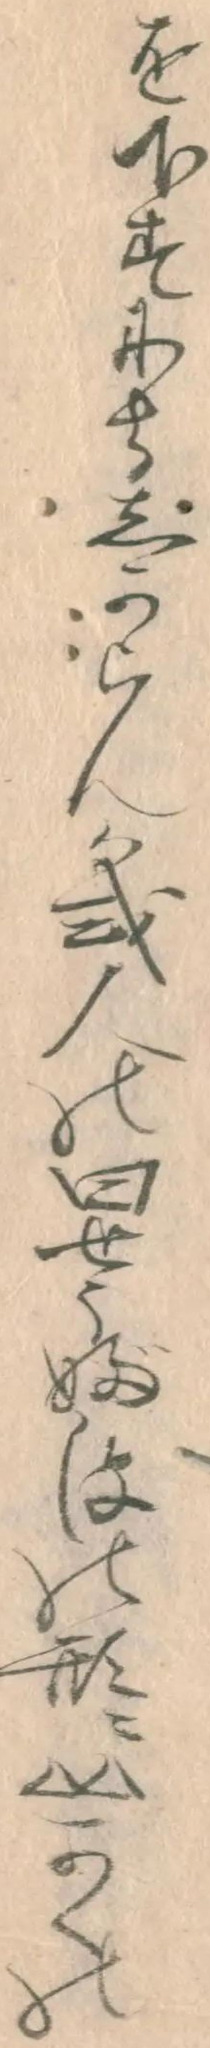を下すにはしからんか或人の曰せうぶはの形にかくの
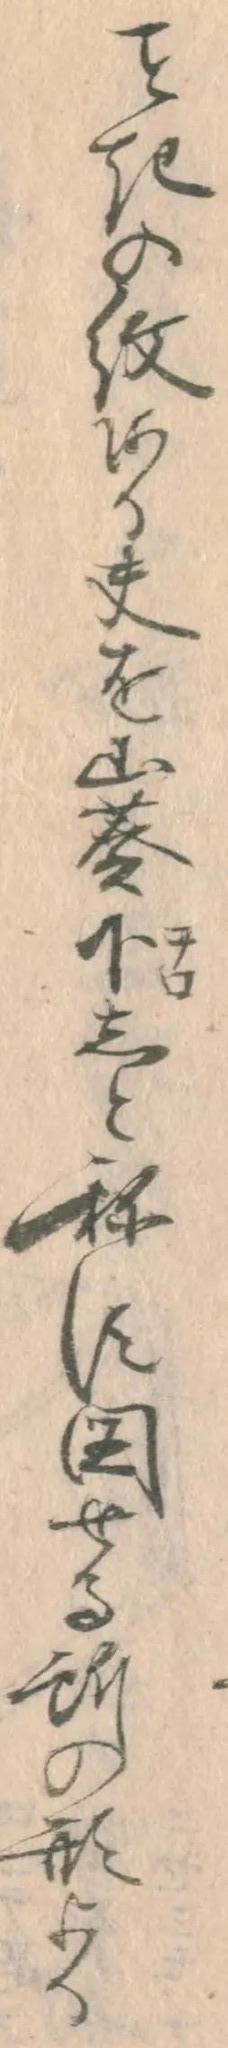こときの紋あり夫を山葵下しと称す図せる所の形より
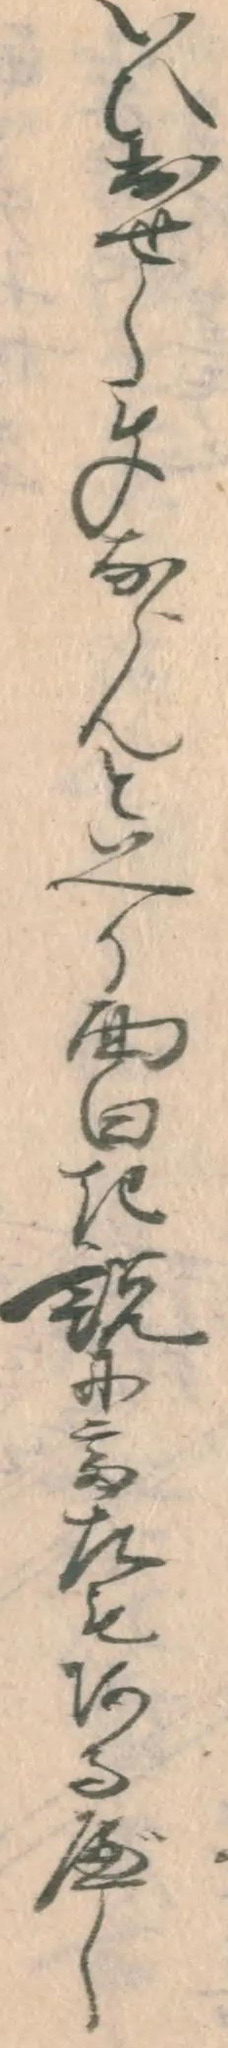いひ出せしものならんといへり面白き説にて左もあるべし
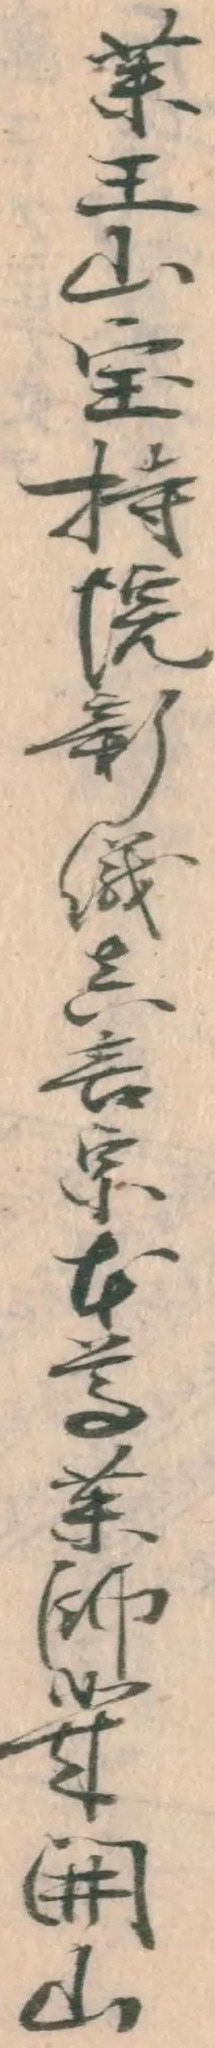薬王山宝持院新儀真言宗本尊薬師如来開山
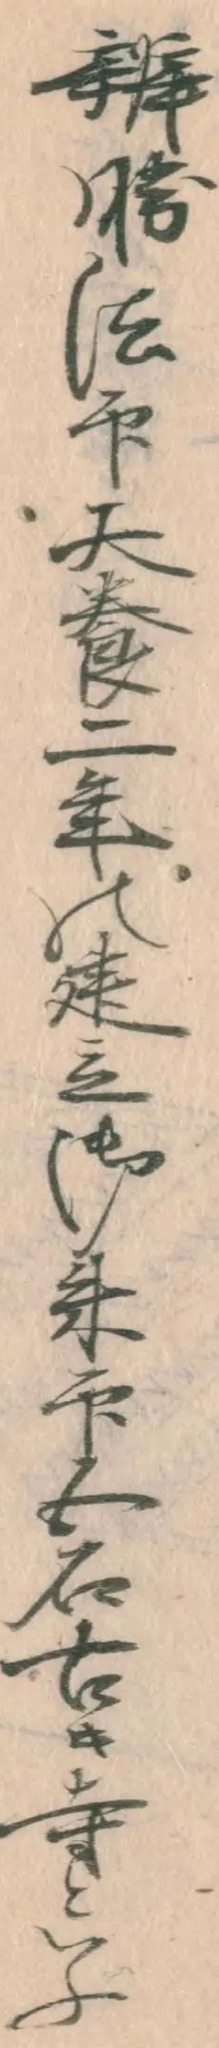弁勝法印天養二年の建立御朱印五石古き寺といふ
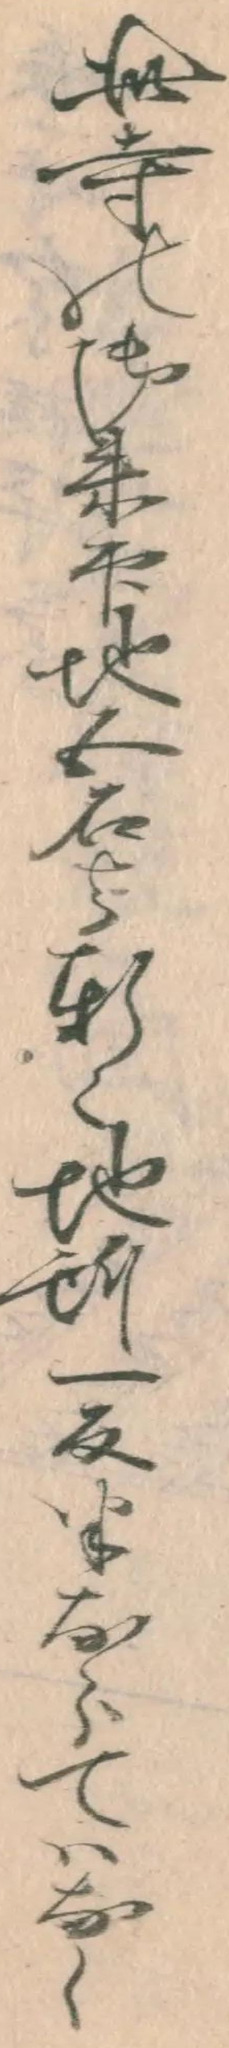此寺の御朱印地五石は斬〳〵地所一反半ならてはなく
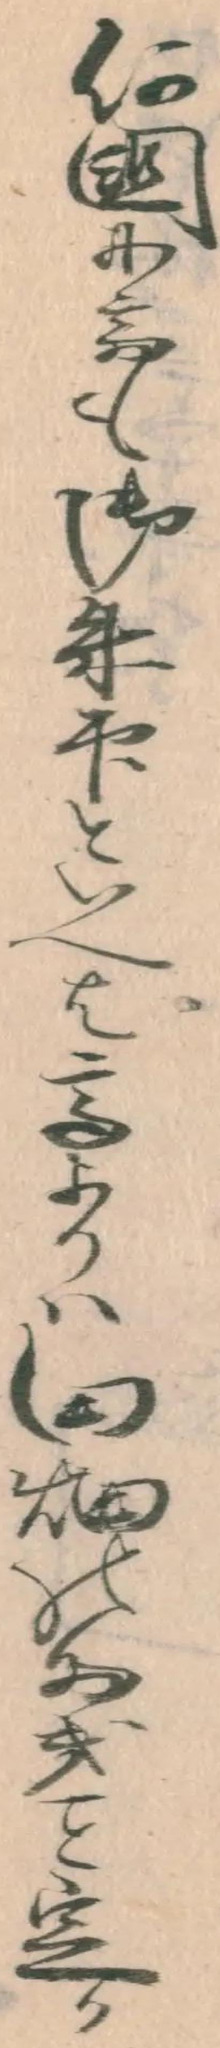何国にても御朱印といへば高よりは田畑の多きこと定り
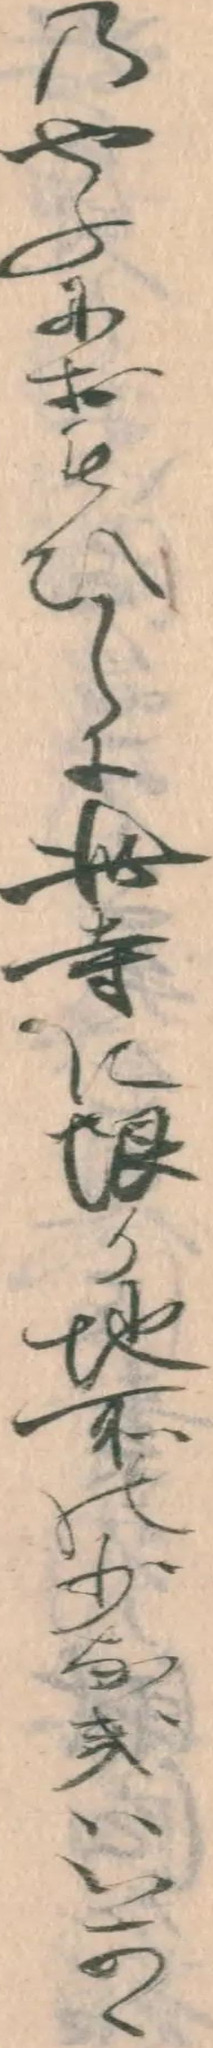のやふにおもひしに此寺に限り地所の少なきはいかゝ
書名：四神地名録 6巻. [4]葛飾郡
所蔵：国立国会図書館 National Diet Library, JAPAN
